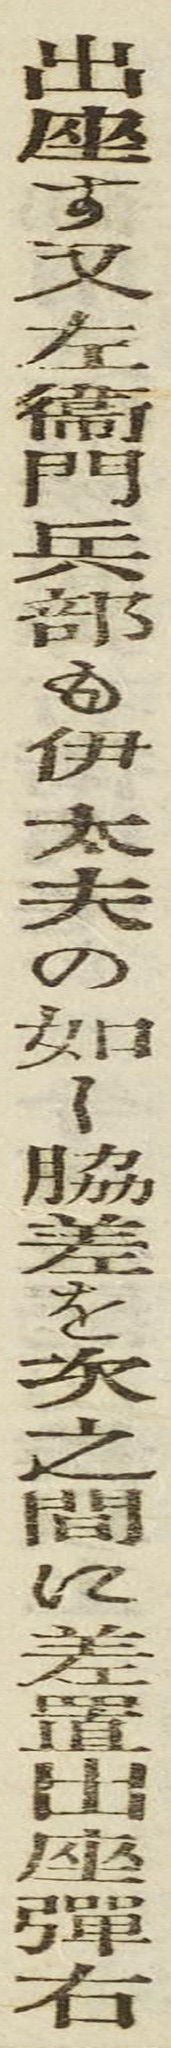出座す又左衞門兵部も伊太夫の如し脇差を次之間に差置出座弾右
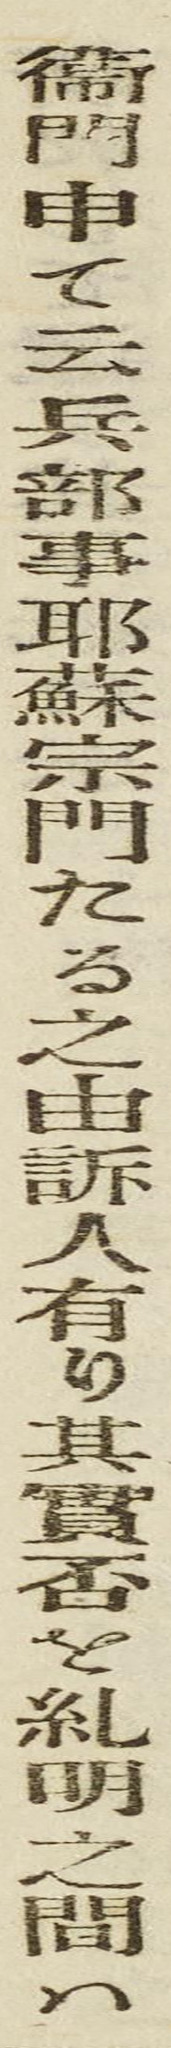衞門申て云兵部事耶蘇宗門たる之由訴人有り其実否を糺明之間は
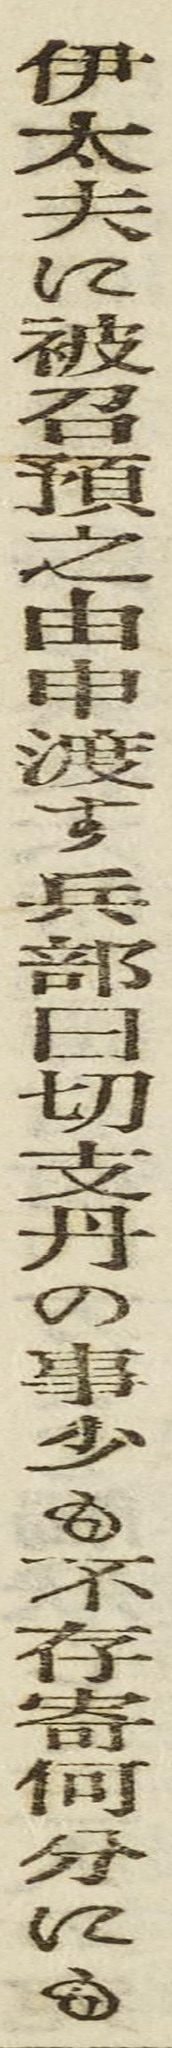伊太夫に被召預之由申渡す兵部曰切支丹の事少も不存寄何分にも
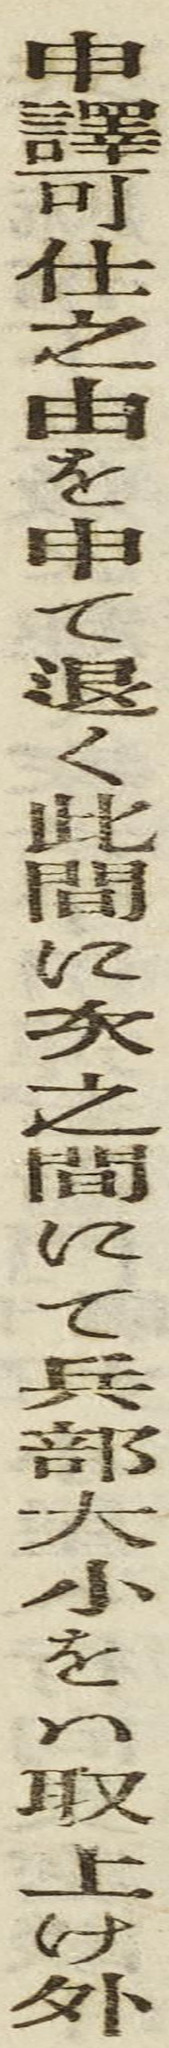申訳可仕之由を申て退く此間に次之間にて兵部大小をは取上け外
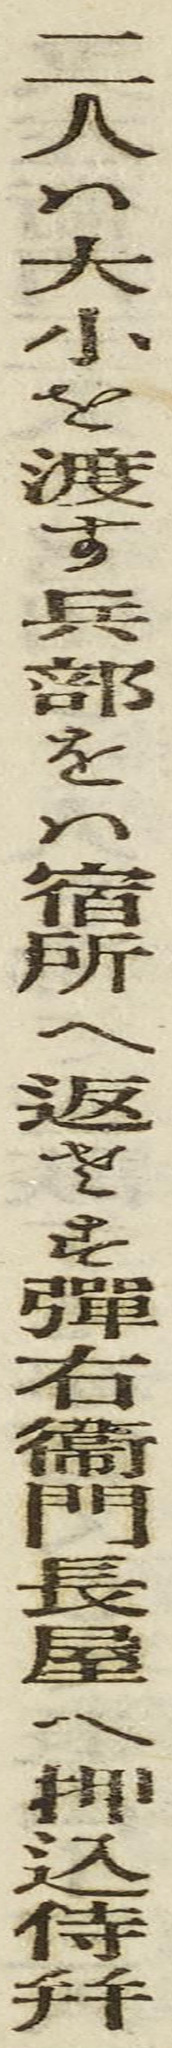二人は大小を渡す兵部をは宿所へ返さす弾右衞門長屋へ押込侍幷
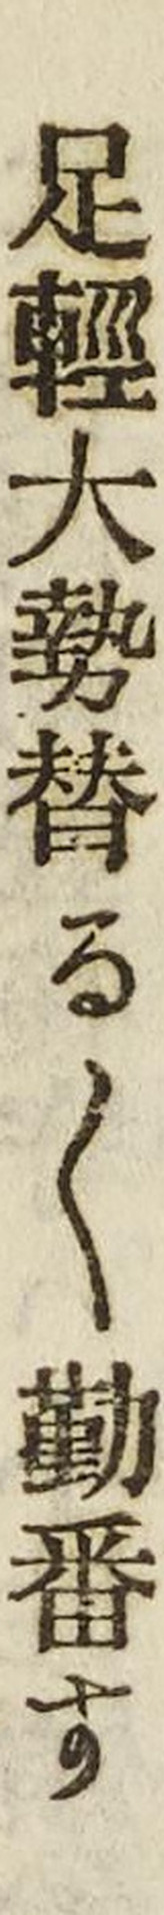足軽大勢替る〳〵勤番す
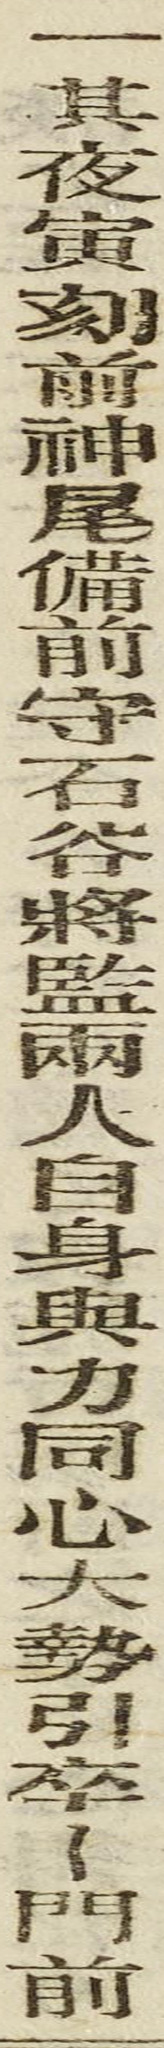一其後寅刻前神尾備前守石谷将監両人自身与力同心大勢引率し門前
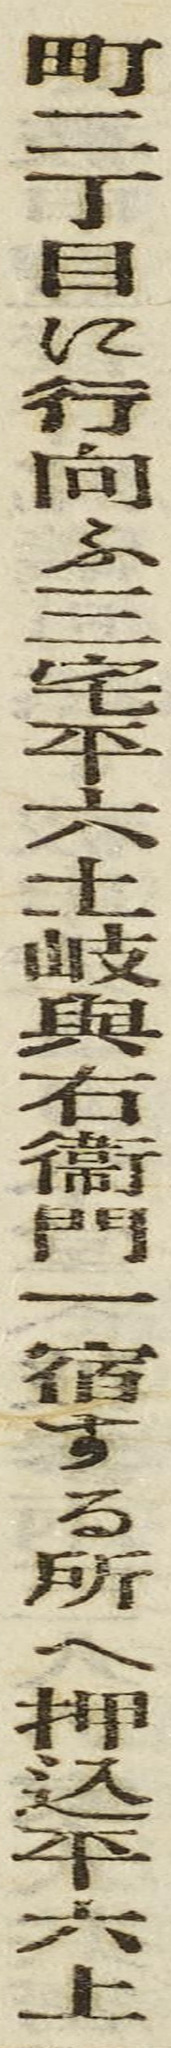町二丁目に行向ふ三宅平六土岐与右衞門一宿する所へ押込平六上
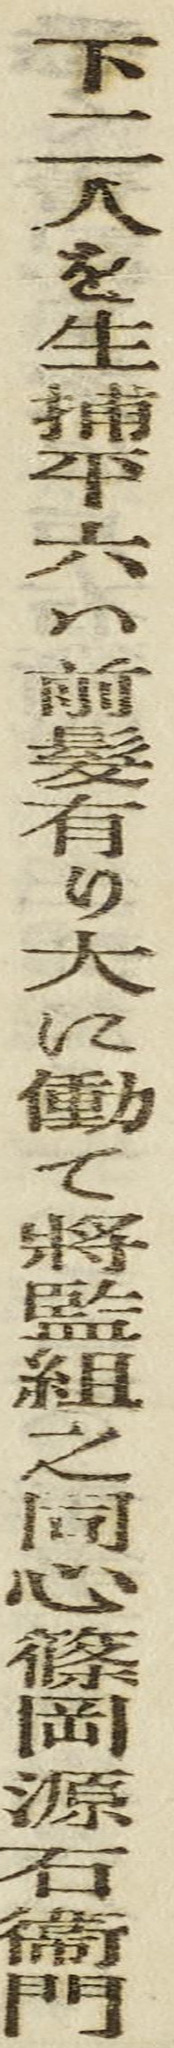下二人を生捕平六は前髪有り大に働て将監組之同心篠岡源右衞門
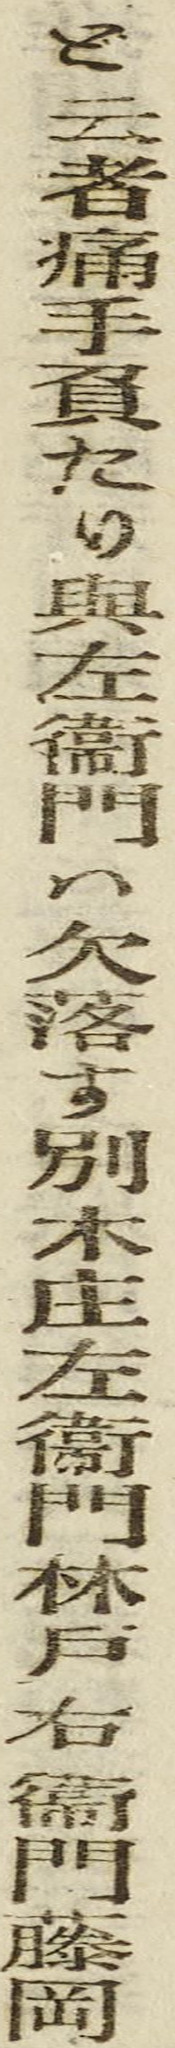と云者痛手負たり与左衞門は欠落す別木庄左衞門林戸右衞門藤岡
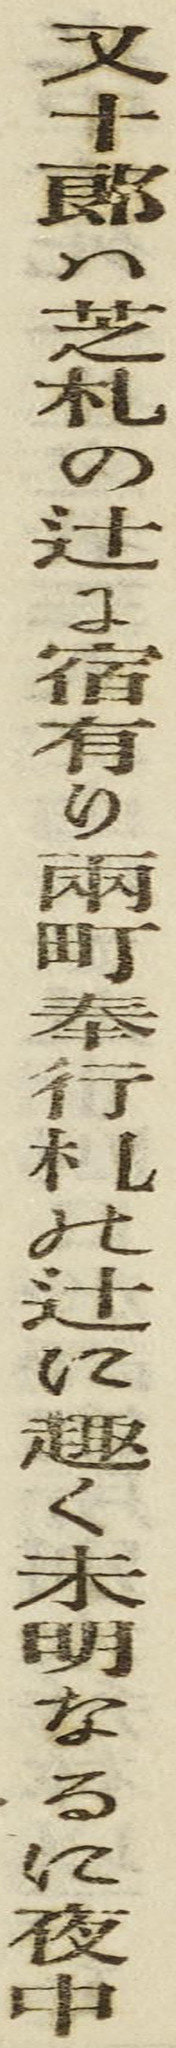又十郎は芝札の辻に宿有り両町奉行札の辻に趣く未明なるに夜中
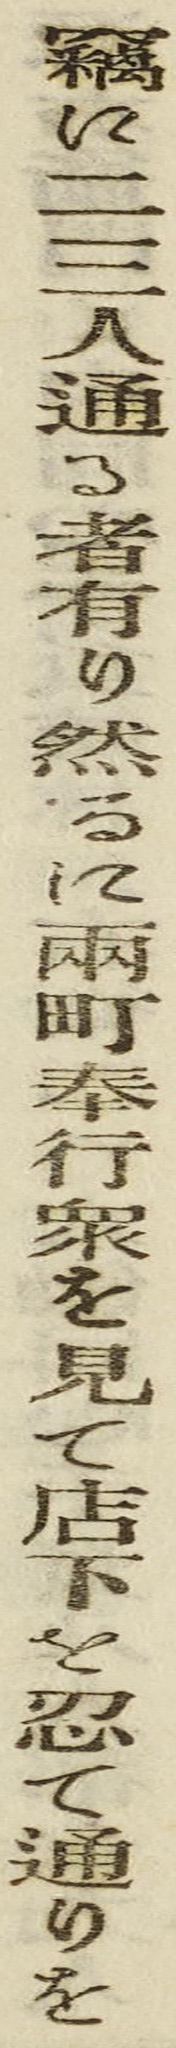竊に二三人通る者有り然るに両町奉行衆を見て店下を忍て通りを
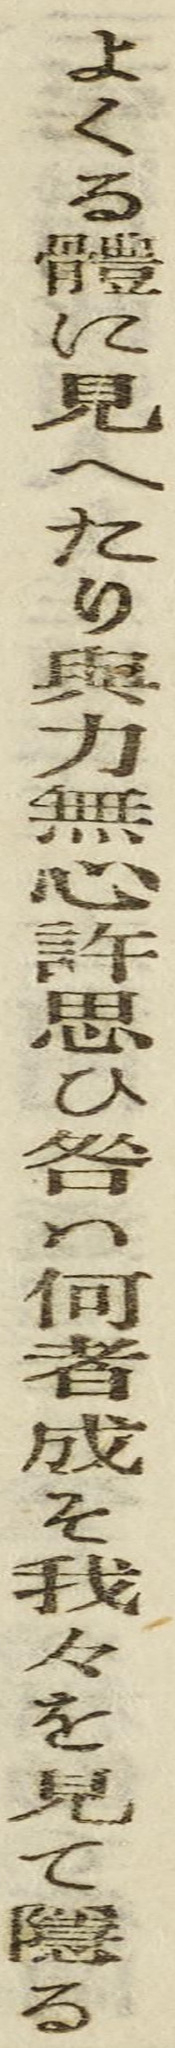よくる体に見へたり与力無心許思ひ咎は何者成そ我々を見て隠る
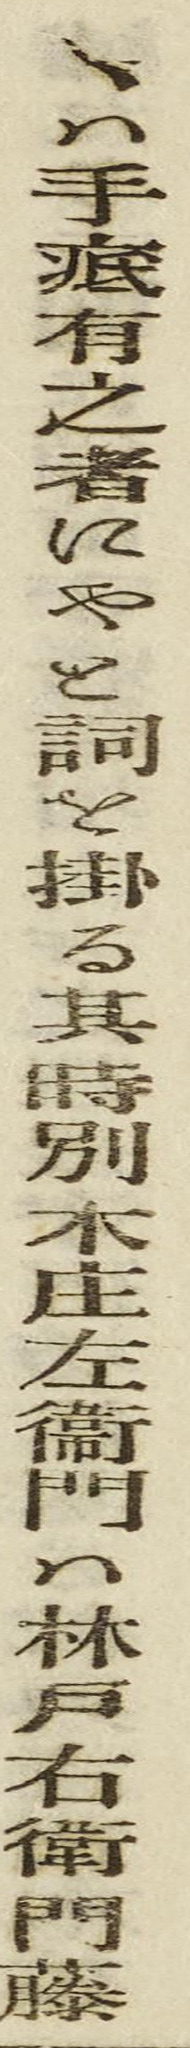ゝは手疵有之者にやと詞を掛る其時別木庄左衞門は林戸右衛門藤
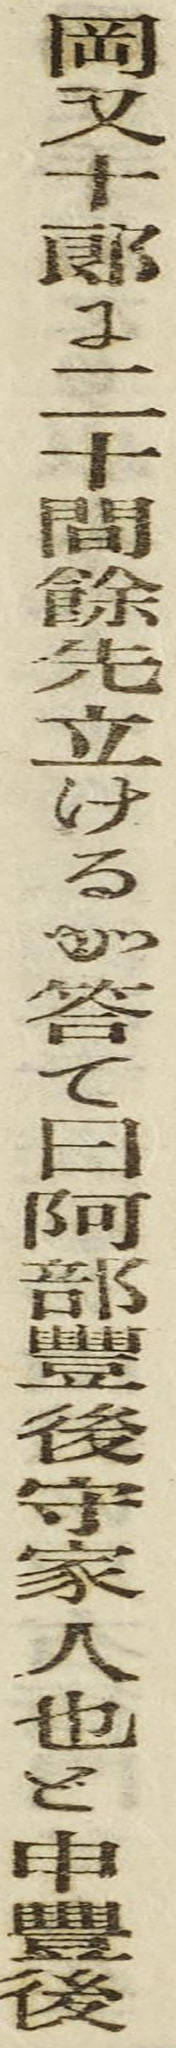岡又十郎に二十間余先立けるか答て曰阿部豊後守家人也と申豊後
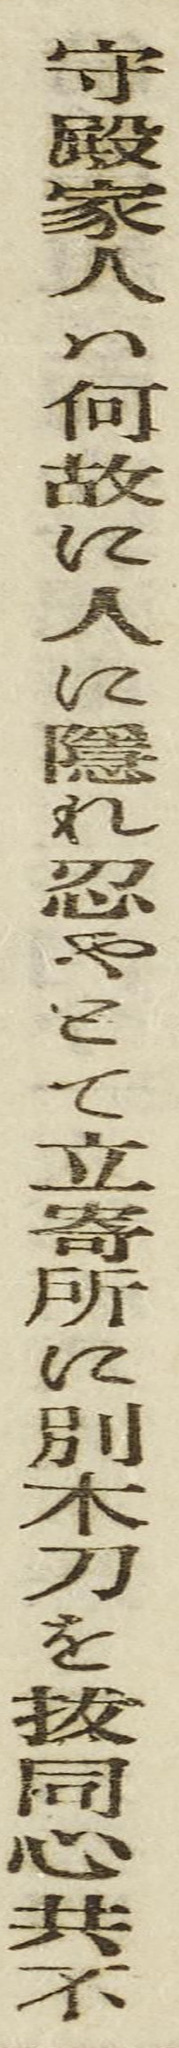守殿家人は何故に人に隠れ忍やとて立寄所に別木刀を抜同心共不
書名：史籍集覽　朝鮮陣古文・細井廣澤記・颶風紀事・天明七年將軍宣下次第書　全
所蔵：東京大学地震研究所図書室 Earthquake Research Institute Library, The University of Tokyo, JAPAN
